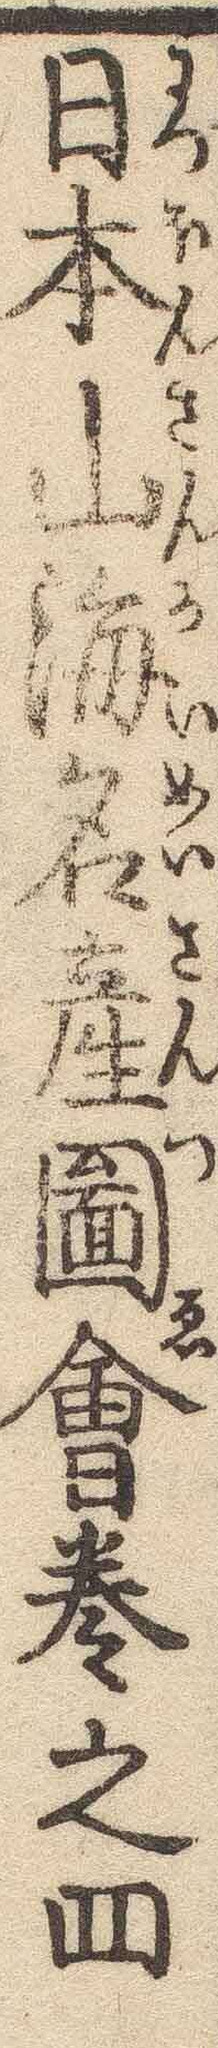日本山海名産図会巻之四
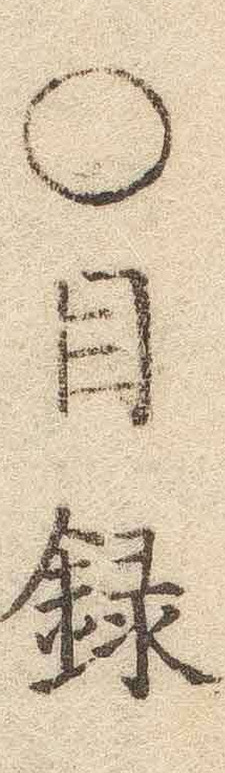○目録

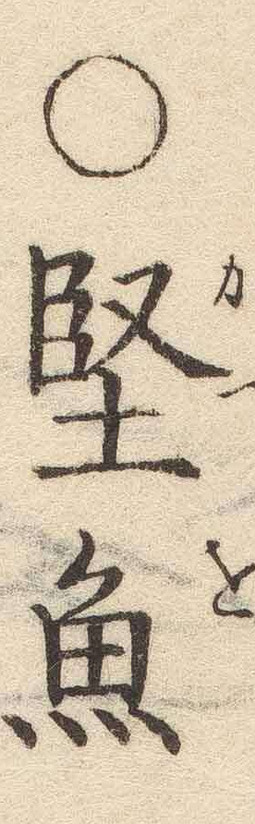○堅魚
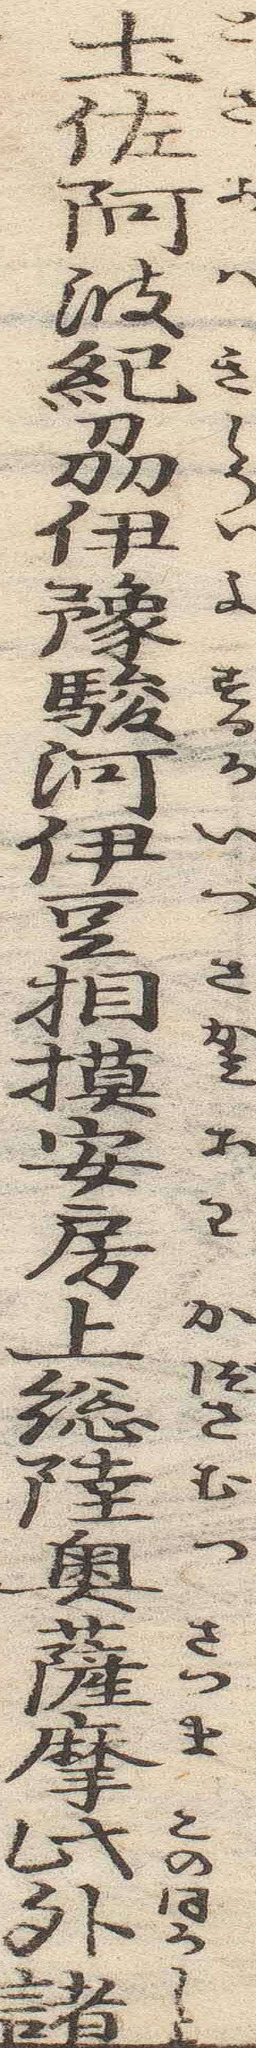土佐阿波紀州伊予駿河伊豆相模安房上総陸奥薩摩此外諸
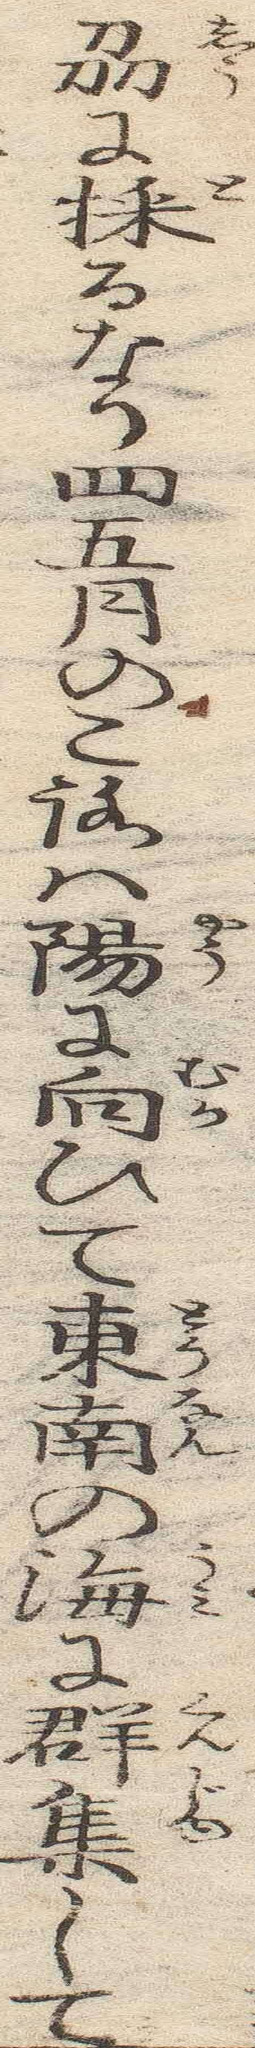州に採るなり四五月のころは陽に向ひて東南の海に群集して
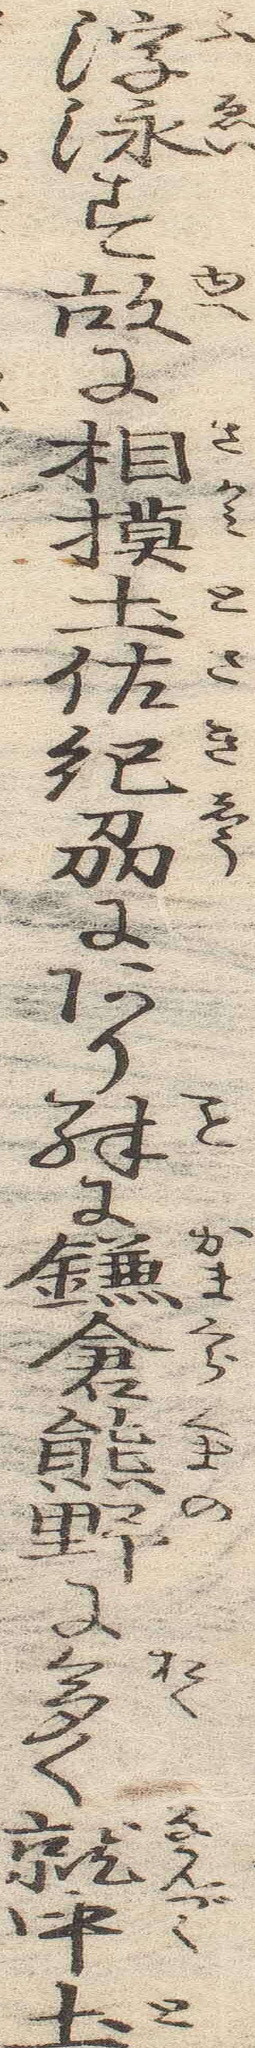浮泳す故に相模土佐紀州にあり殊に鎌倉熊野に多く就中土
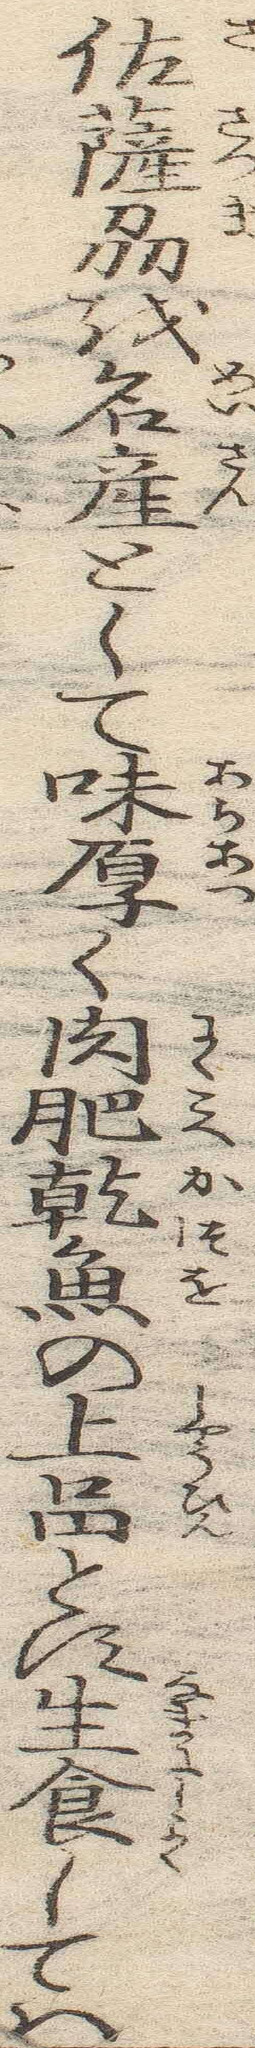佐薩州を名産として味厚く肉肥乾魚の上品とす生食しては
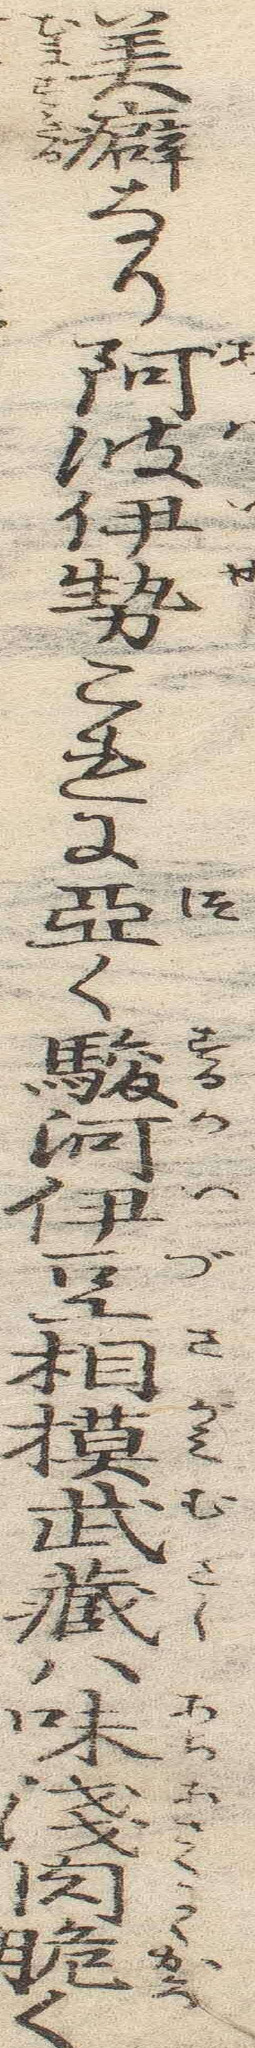美癖なり阿波伊勢これに亜く駿河伊豆相模武蔵は味浅肉脆く
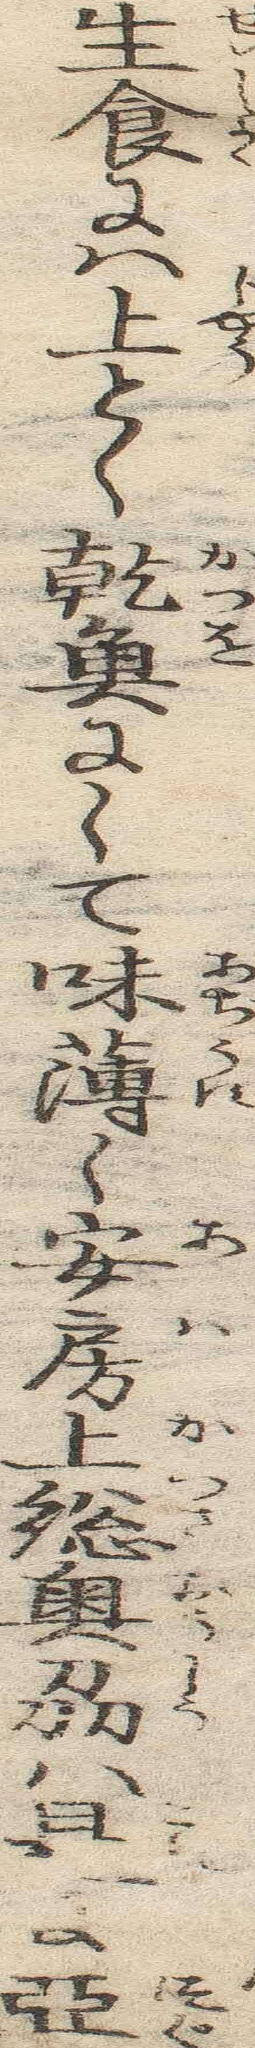生食には上とし乾魚にして味薄し安房上総奥州は是に亜
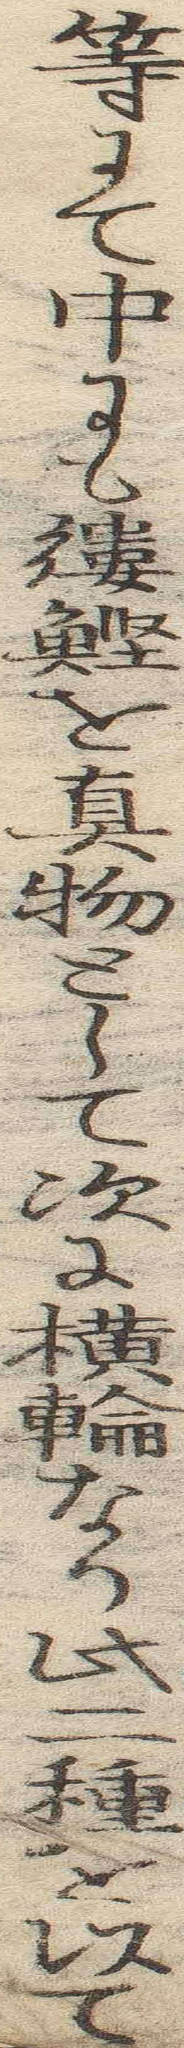等にて中にも縷鰹を真物として次に横輪なり此二種を以て
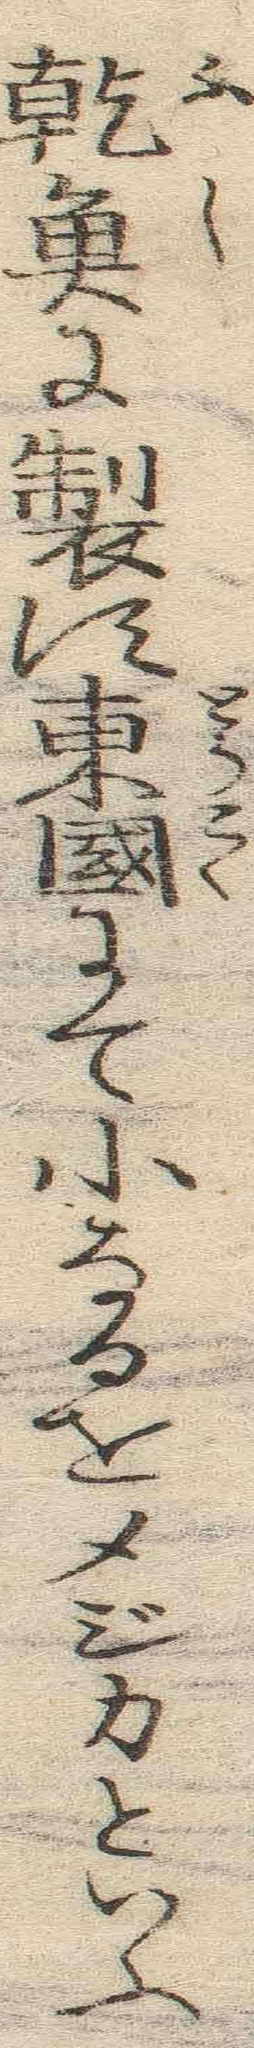乾魚に製す東国にて小なるをメジカといふ
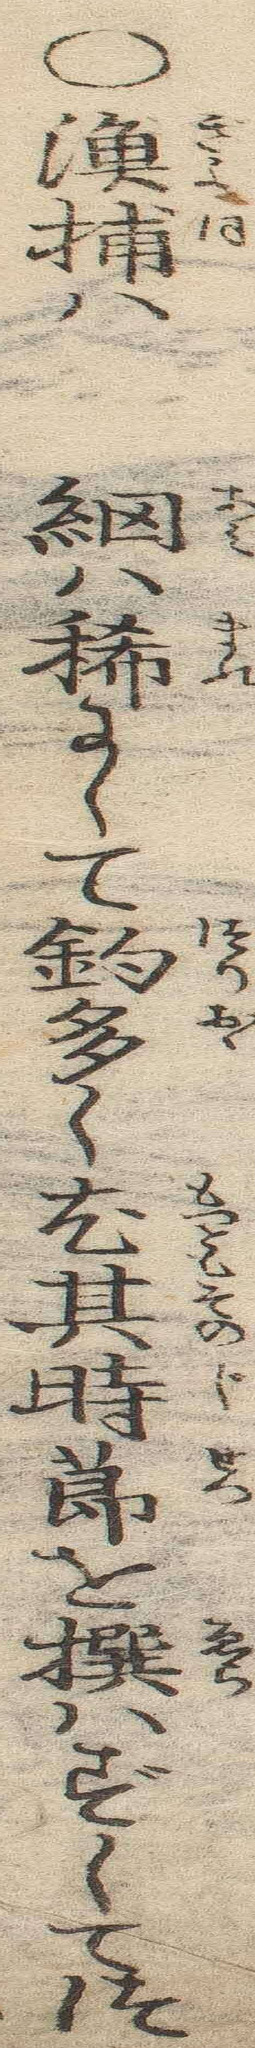○漁捕は網は稀にして釣多し尤其時節を撰はずしてつ
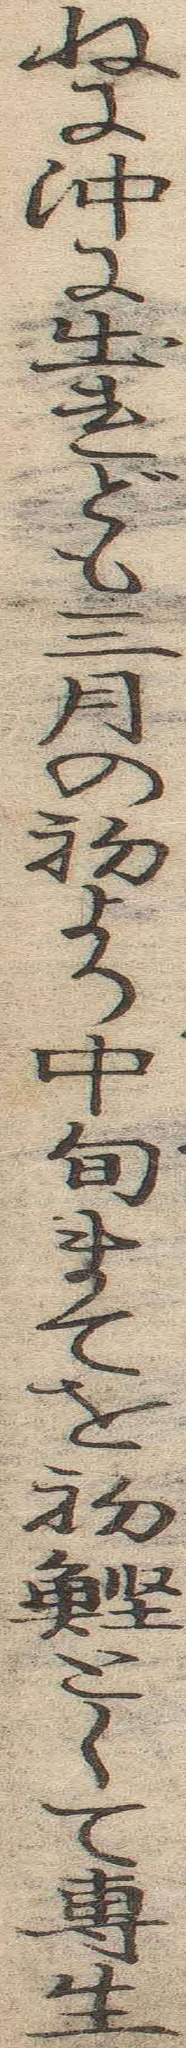ねに沖に出れども三月の初より中旬まてを初鰹として専生

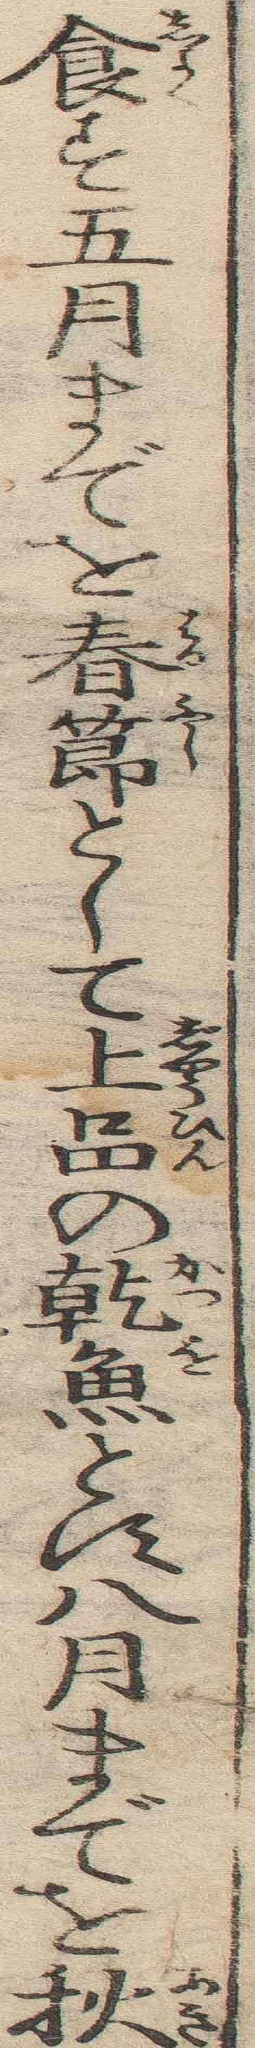食す五月までを春節として上品の乾魚とす八月までを秋
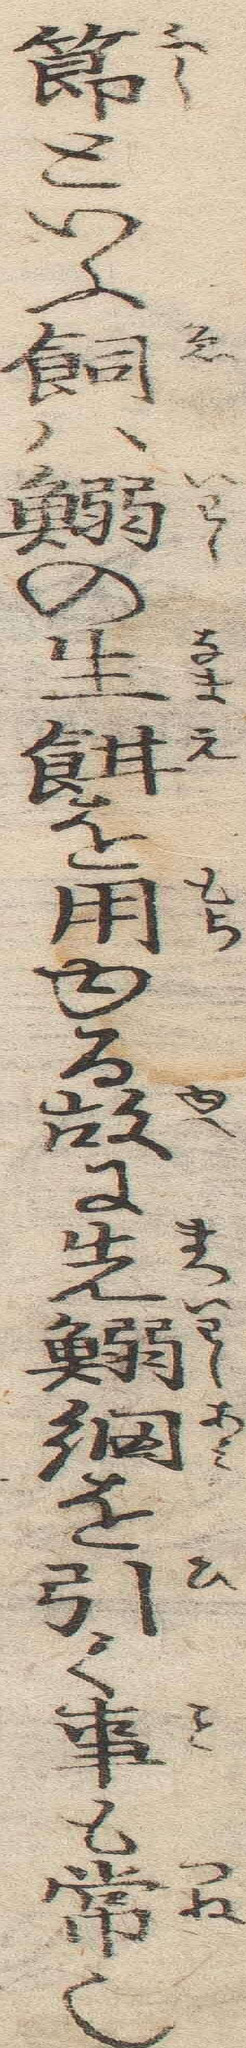節という飼は鰯の生餌を用ゆる故に先鰯網を引く事も常也
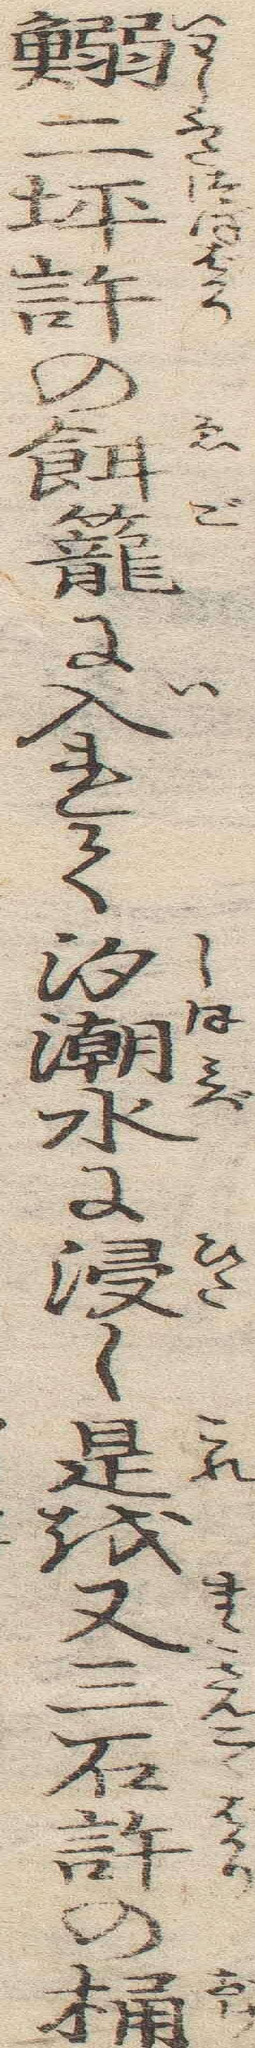鰯二坪許の餌籠に入れて汐潮水に浸し是を又三石許の桶
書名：日本山海名産図会
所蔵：東京学芸大学附属図書館 国文学研究資料館
